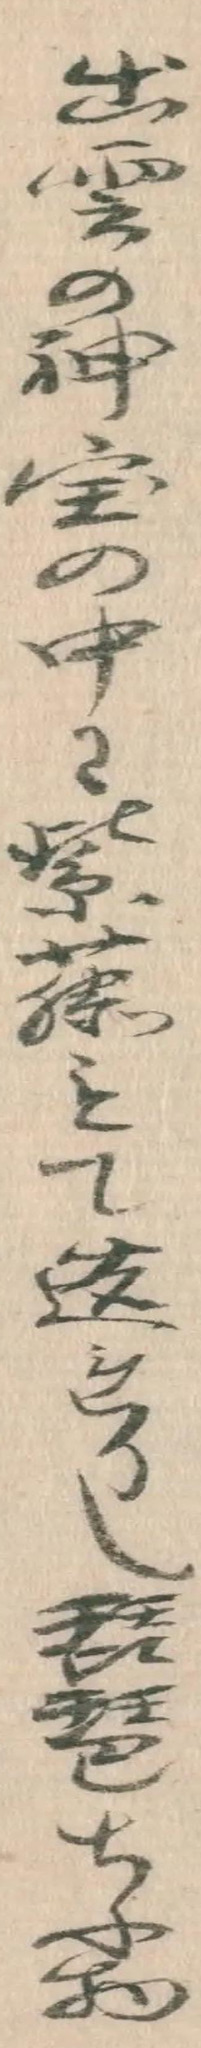出雲の神宝の中に紫藤もて造れりし琵琶ちふ物
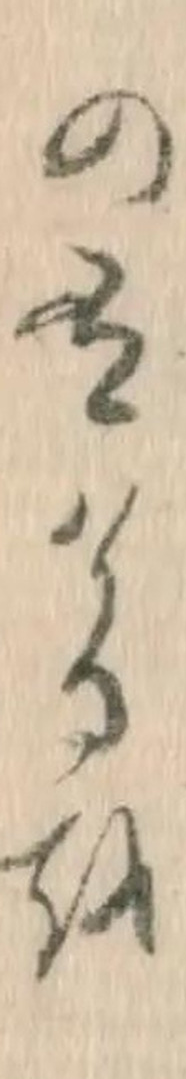の有けるを
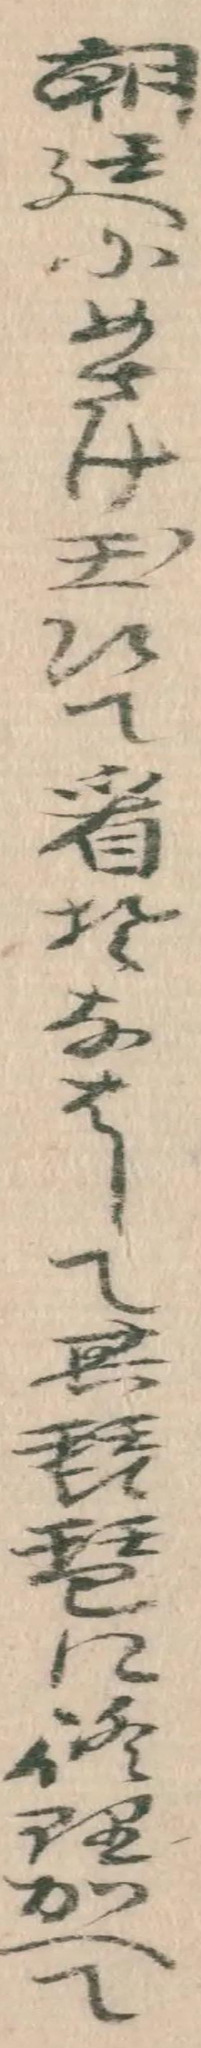朝廷にめさけ玉ひて看そなはして其琵琶に修理加へて
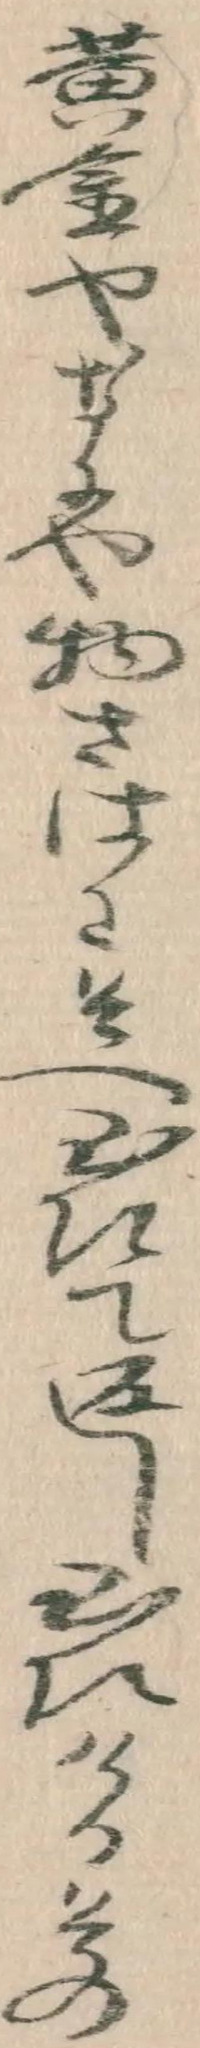黄金やなにや物さはにそへ玉ひて返し玉ひけるその
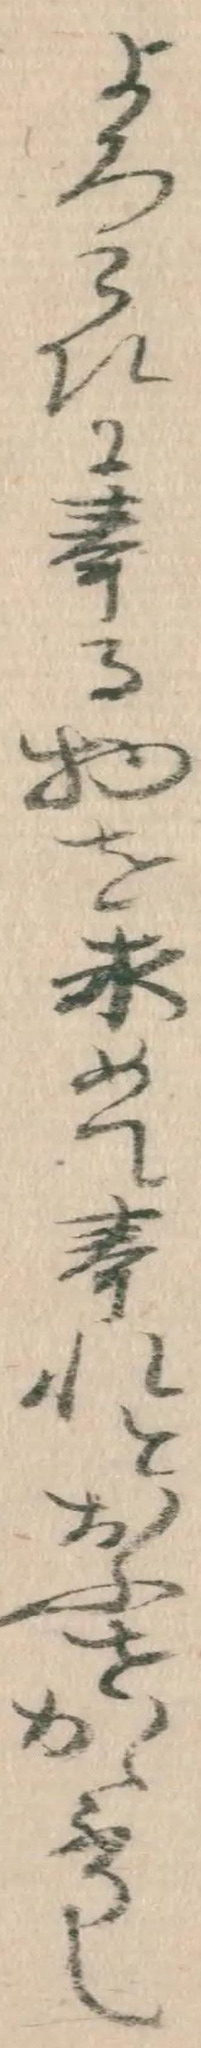よろこひに奉る物を求めて奉れとおふせかゝふりし
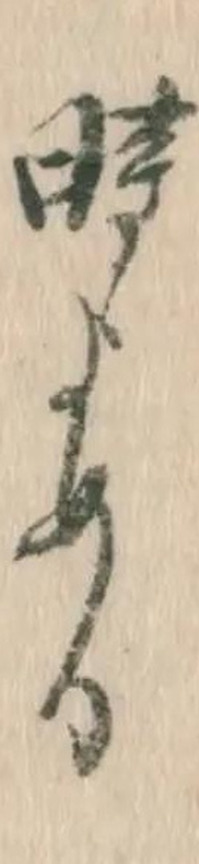時よめる
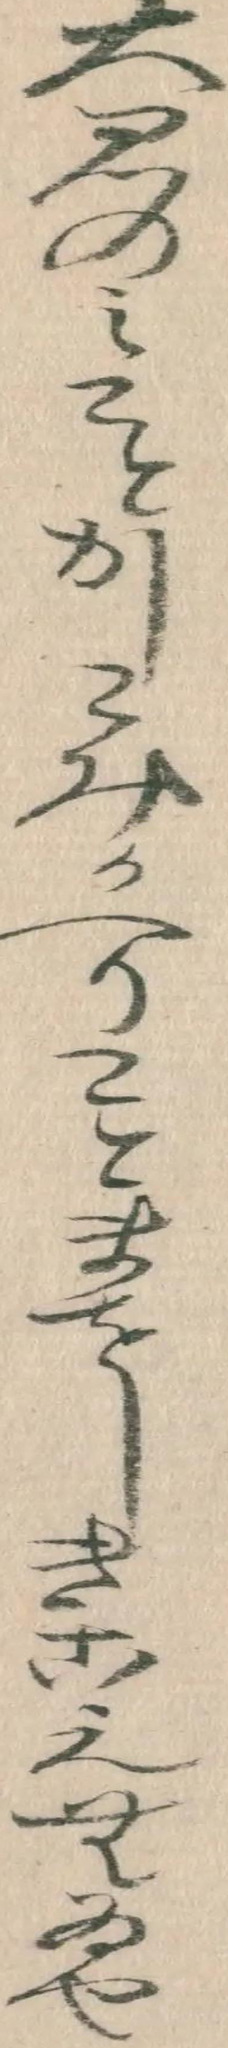大君のみことかしこみかへりことまをしきこえむゐや
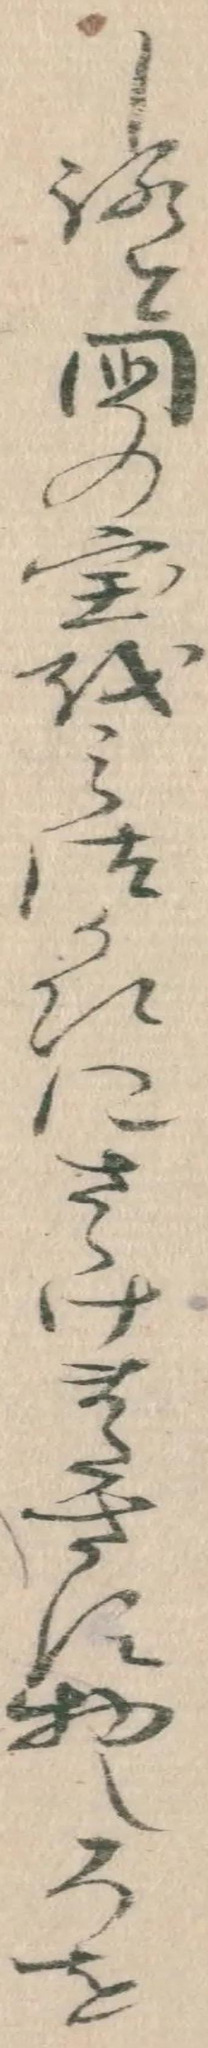しろと国の宝をみつかひにさゝけまたさす物しろを
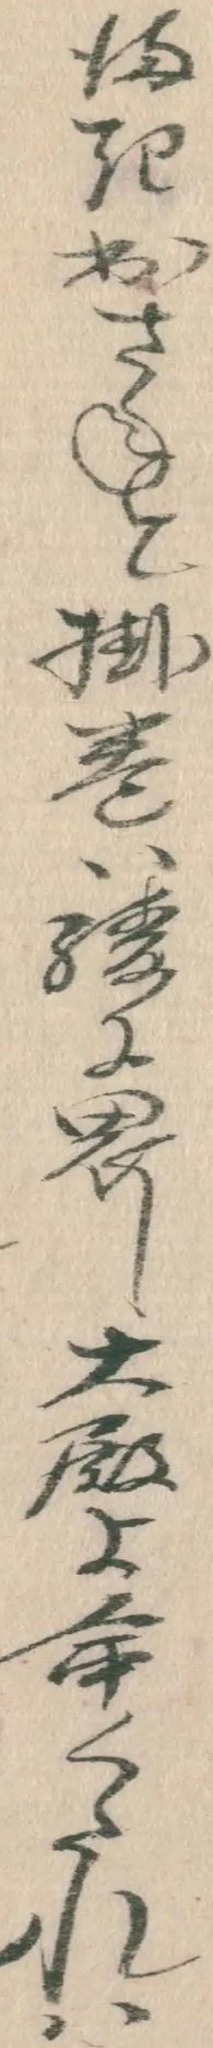まき出さねと掛巻は綾に畏し大殿よ命くたれは
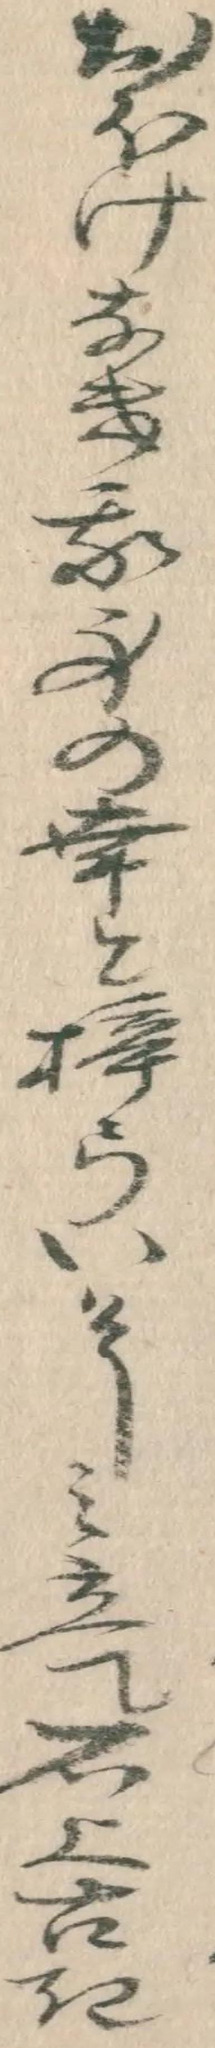おほけなき我身の幸と梓弓いそしみ立て石上古き
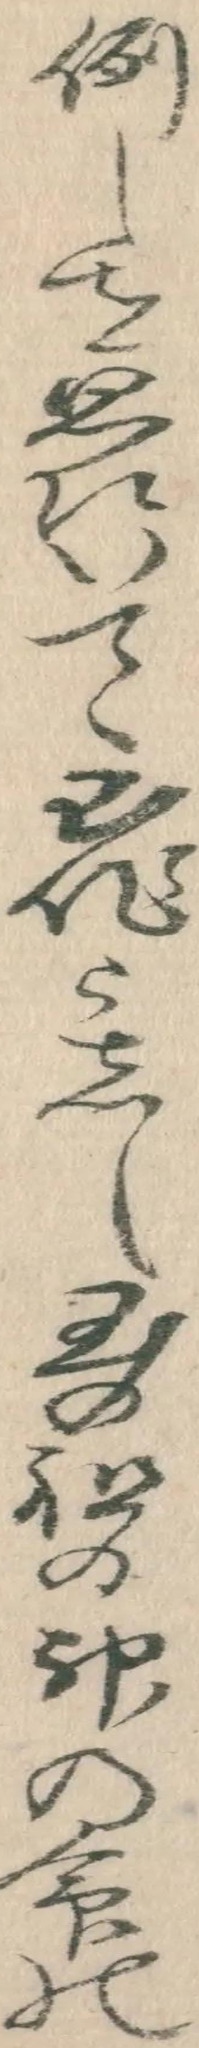例しを思ひいてゝ玉造らしし玉の祖の神の命の
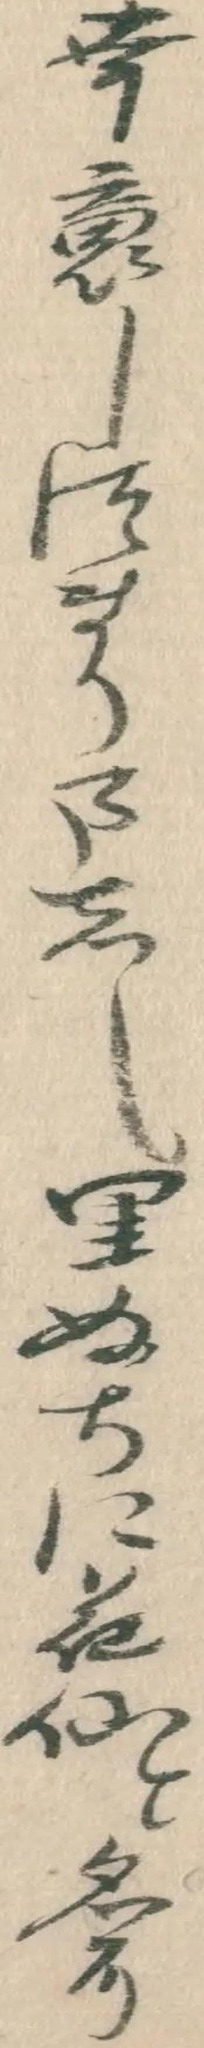幸のしつまりましし里ぬちに花仙と名に

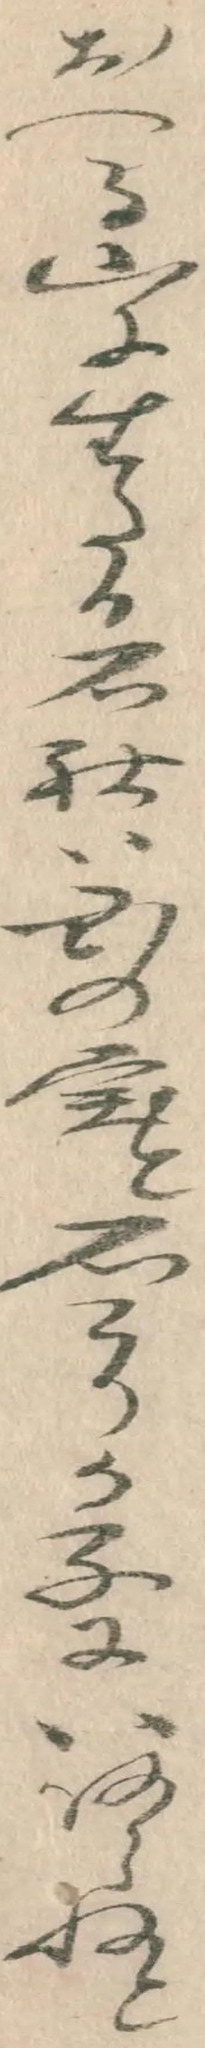おへる山に生たる石社は国の宝と石こりか子にはあらねと
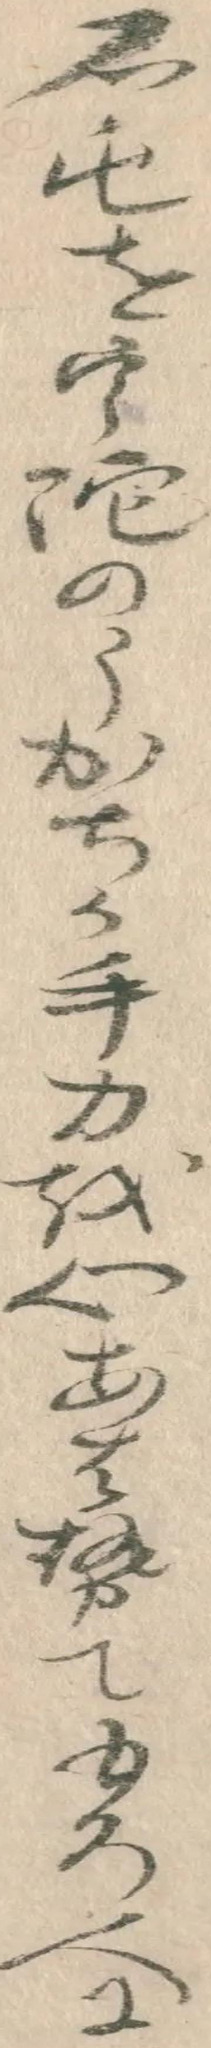石屯を宇陀のうかちか手力を心あはせてもろ人に
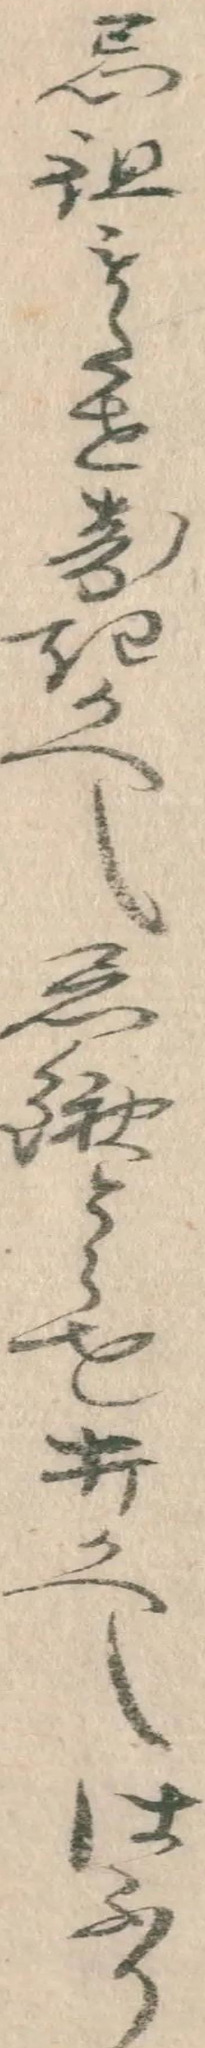忌鉏もたせすきかへし忌鍬とらせ打かへしはふり
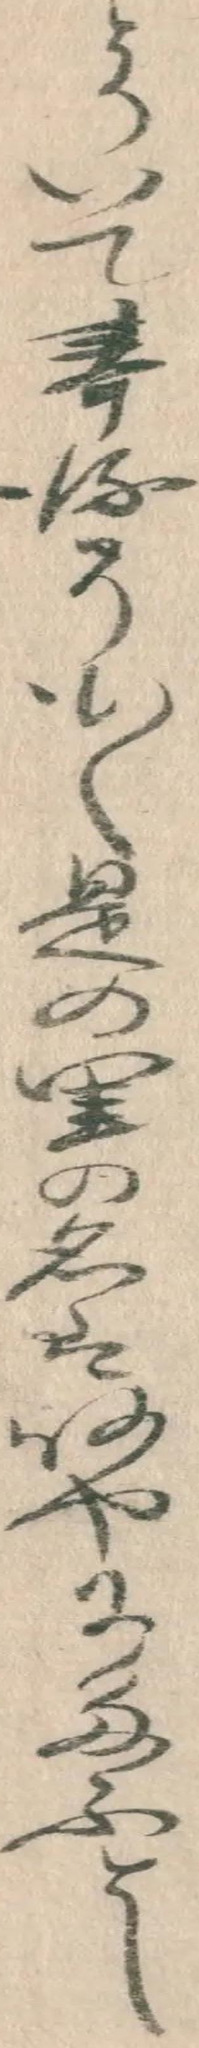とりいて奉るそも〳〵是の里の名はあやにたふとし
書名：出雲紀行. 20
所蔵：国立国会図書館 National Diet Library, JAPAN
